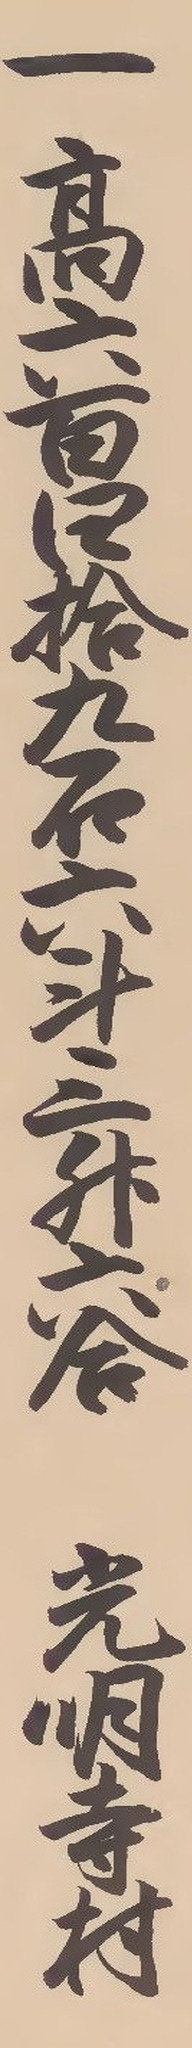一高六百四拾九石六斗三升六合光明寺村

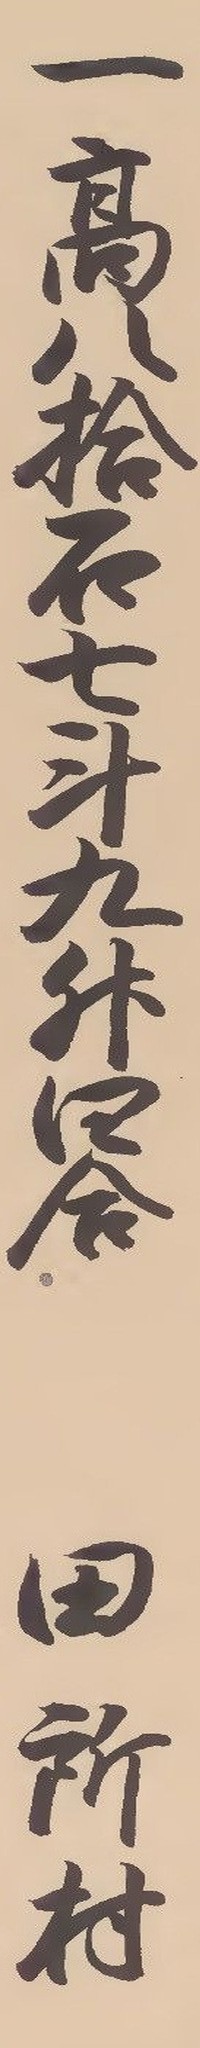一高八拾石七斗九升四合田所村
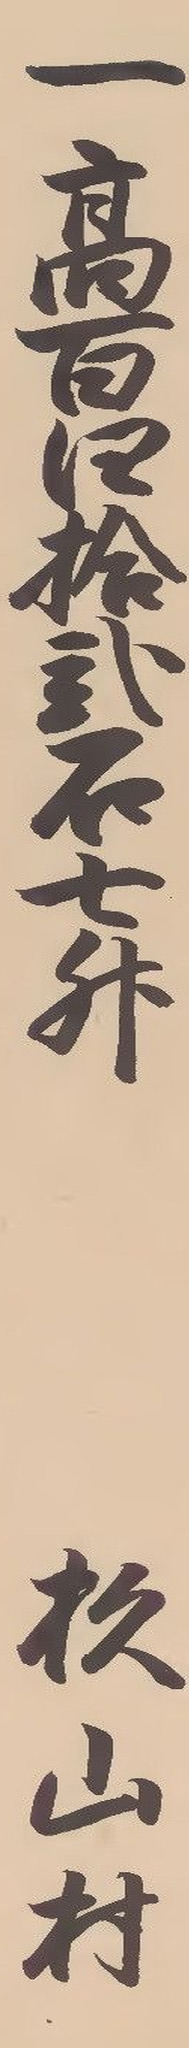一高百四拾弐石七升杉山村
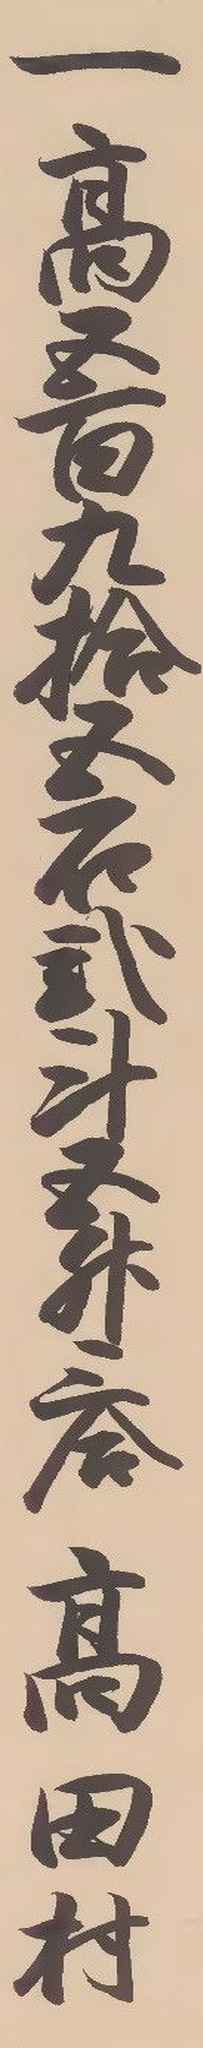一高五百九拾五石弐斗五升三合高田村
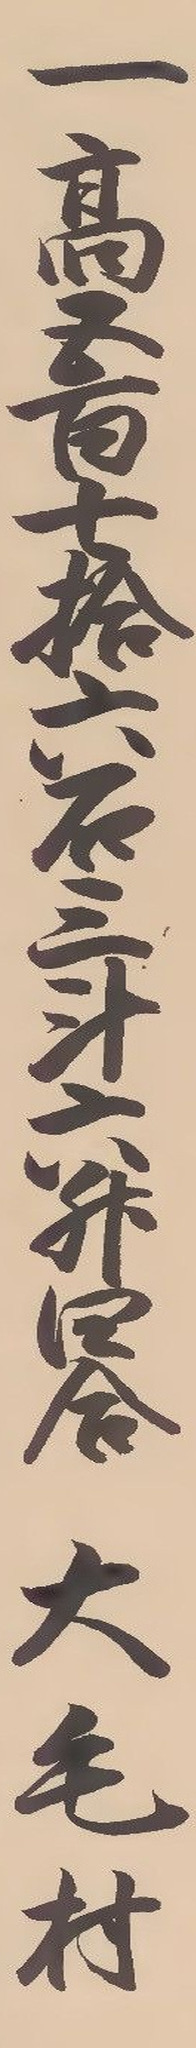一高五百七拾六石三斗六升四合大毛村
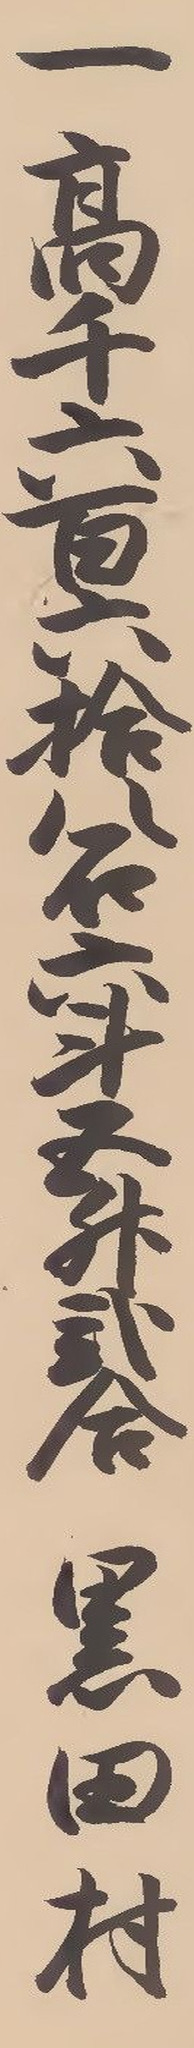一高千六百六拾八石六斗五升弐合黒田村
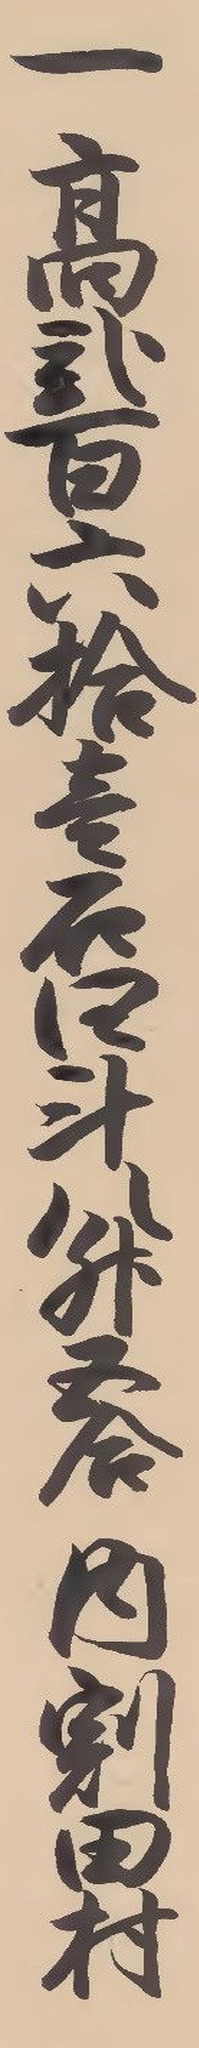一高弐百六拾壱石四斗八升五合内割田村
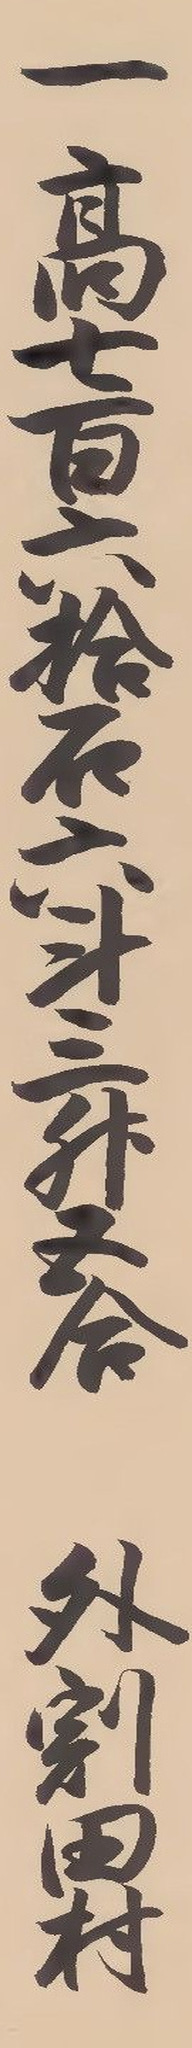一高七百六拾石六斗三升五合外割田村
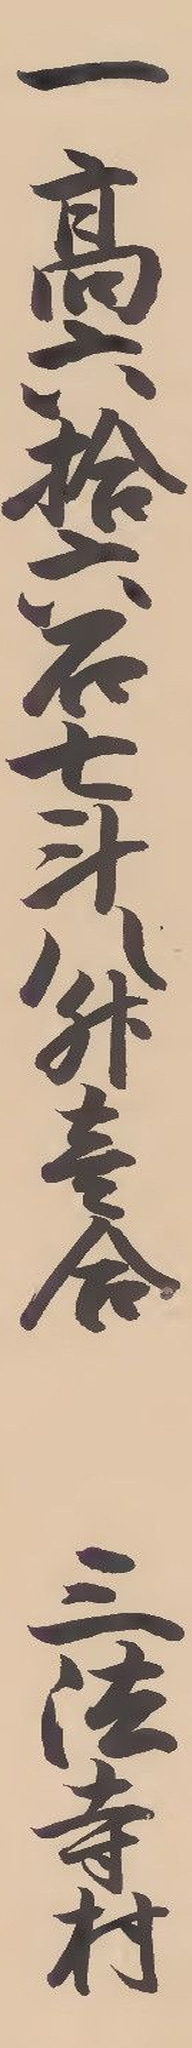一高六拾六石七斗八升壱合三法寺村

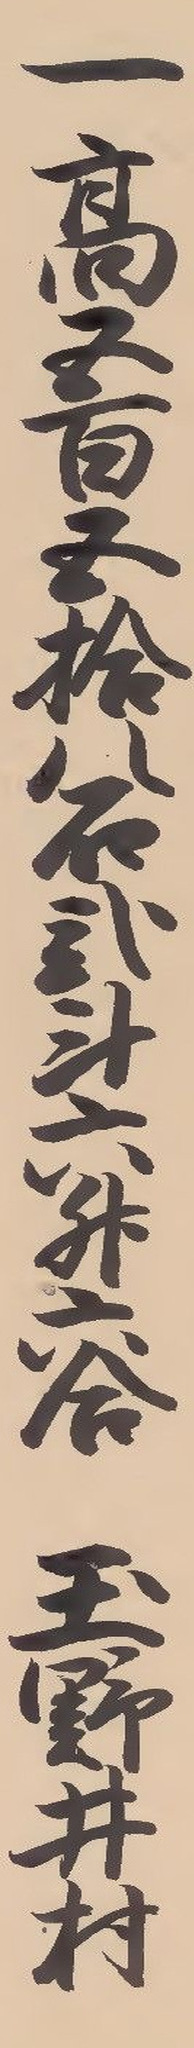一高五百五拾八石弐斗六升六合玉野井村
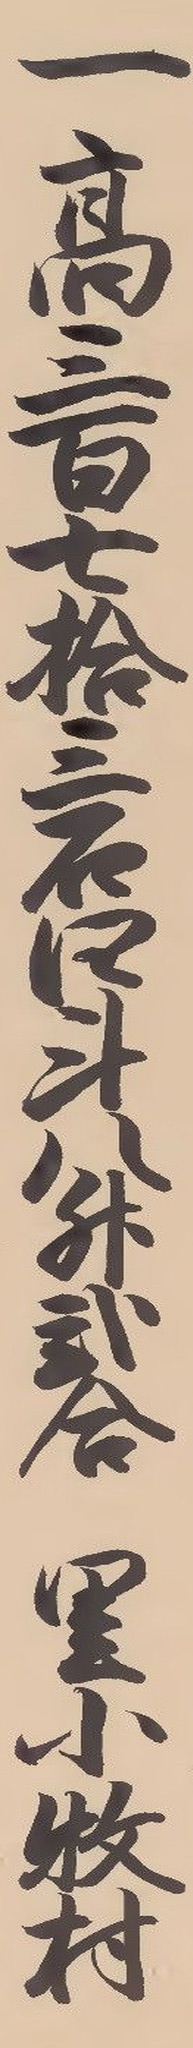一高三百七拾三石四斗八升弐合里小牧村
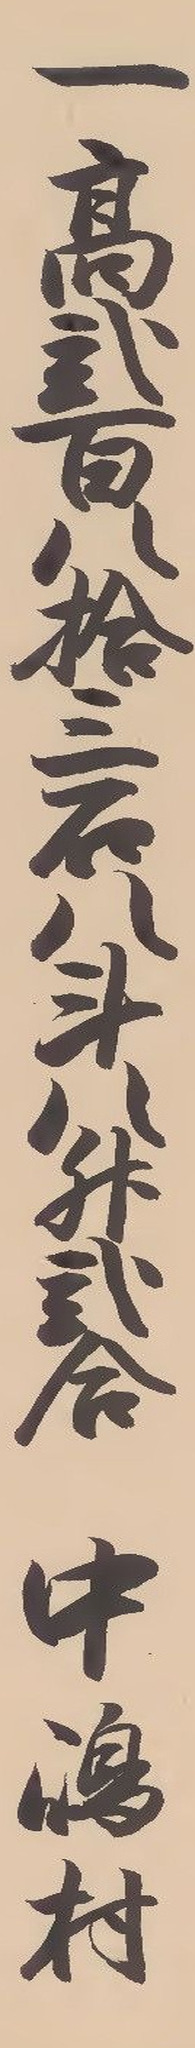一高弐百八拾三石八斗八升弐合中島村
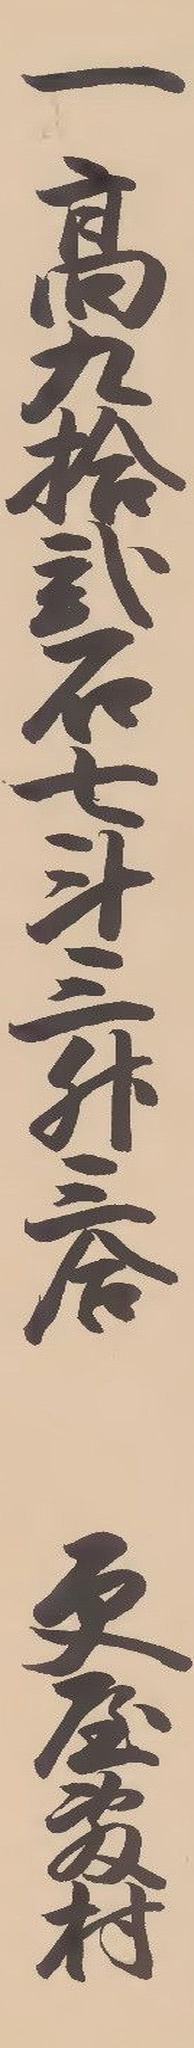一高九拾弐石七斗三升三合更屋敷村
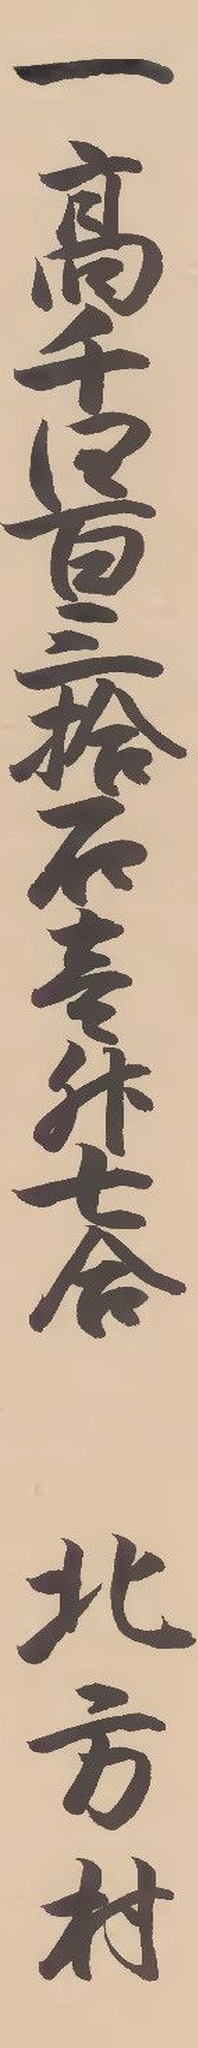一高千四百三拾石壱升七合北方村
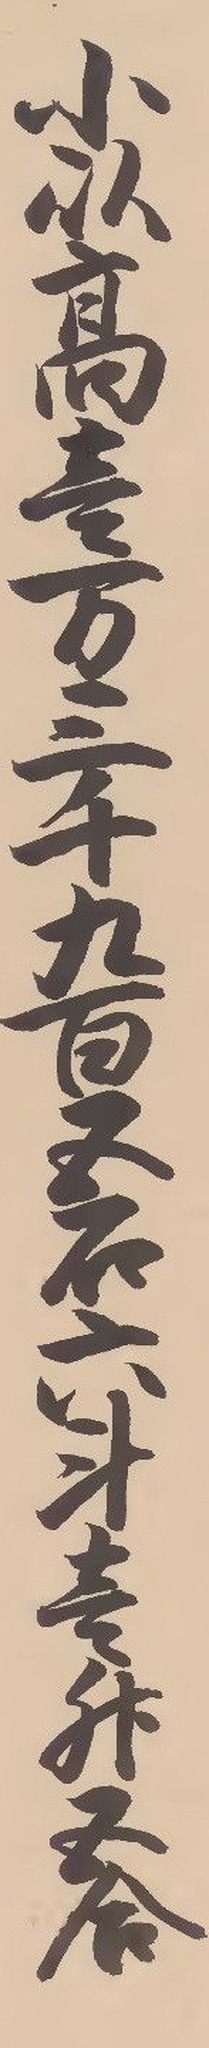小以高壱万三千九百五石六斗壱升五合

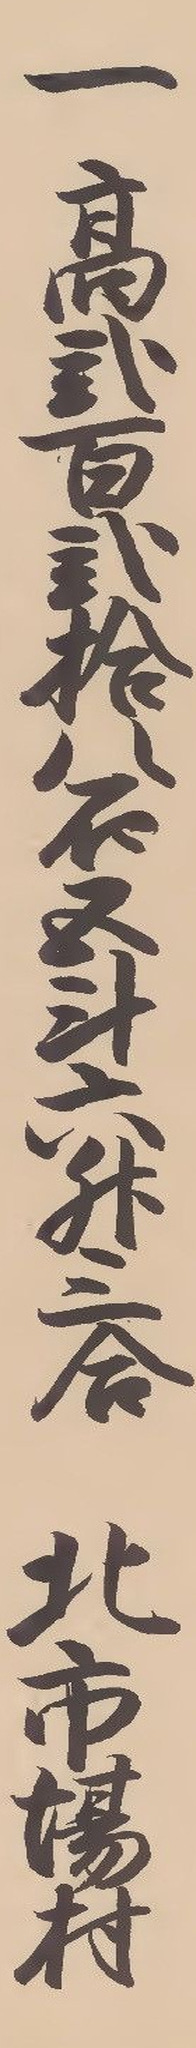一高弐百弐拾八石五斗六升三合北市場村
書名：尾張国郷帳
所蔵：国立公文書館 National Archives of Japan
